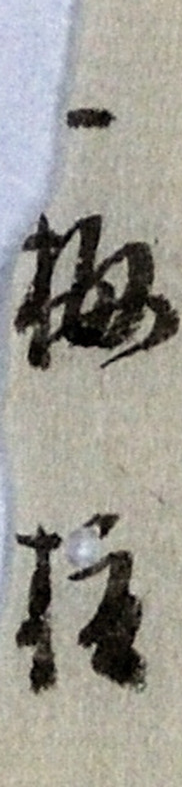一栂柱
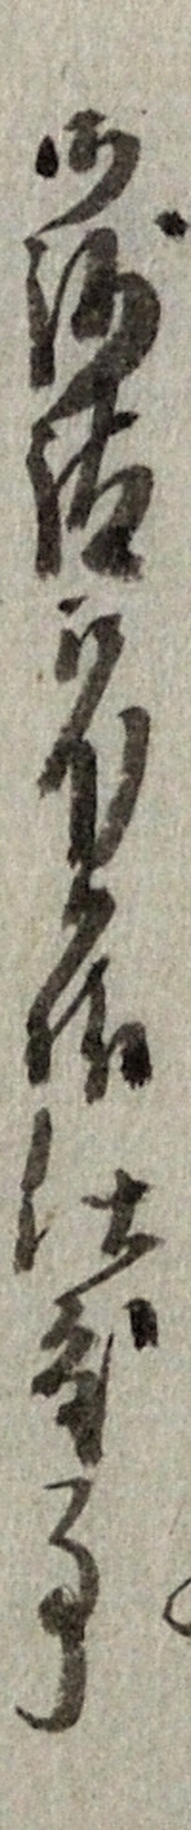御沙汰被下候様仕度事
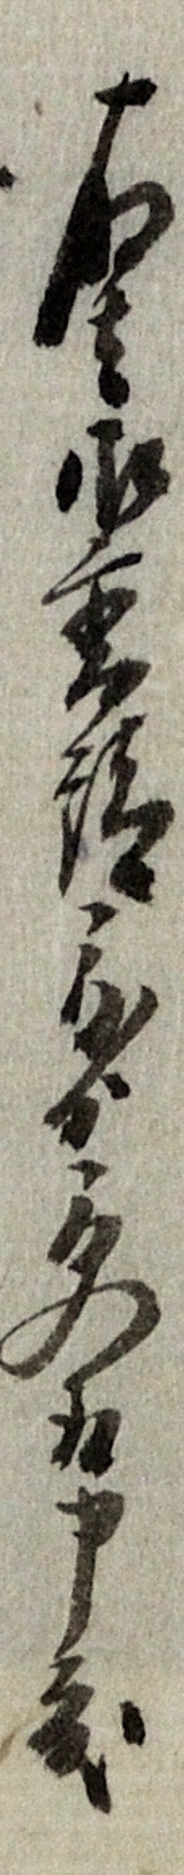右者御普請方ゟ受取申度
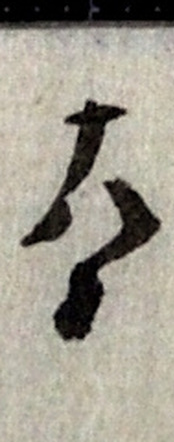十八日
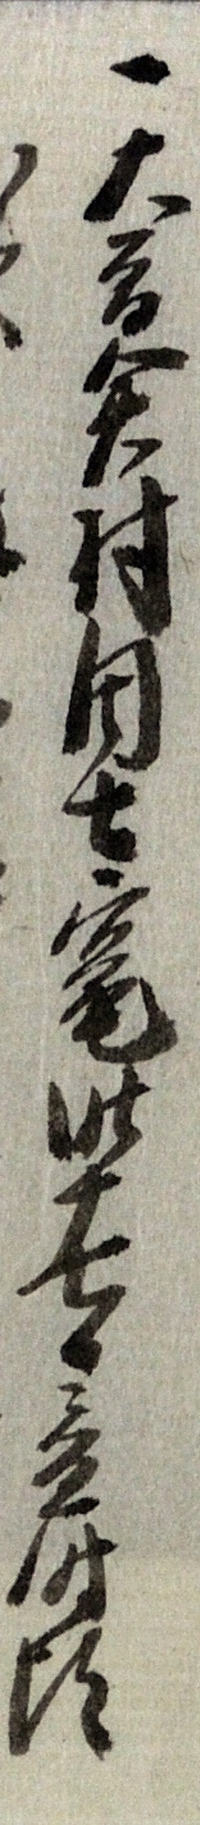一大曽倉村周七竃昨十七日昼時頃
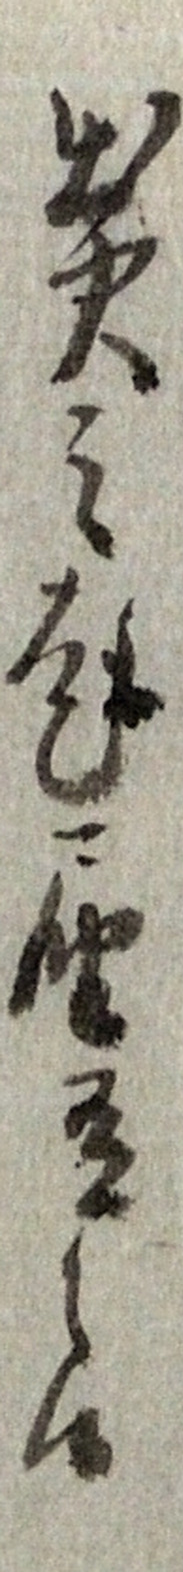出火之趣届有之候
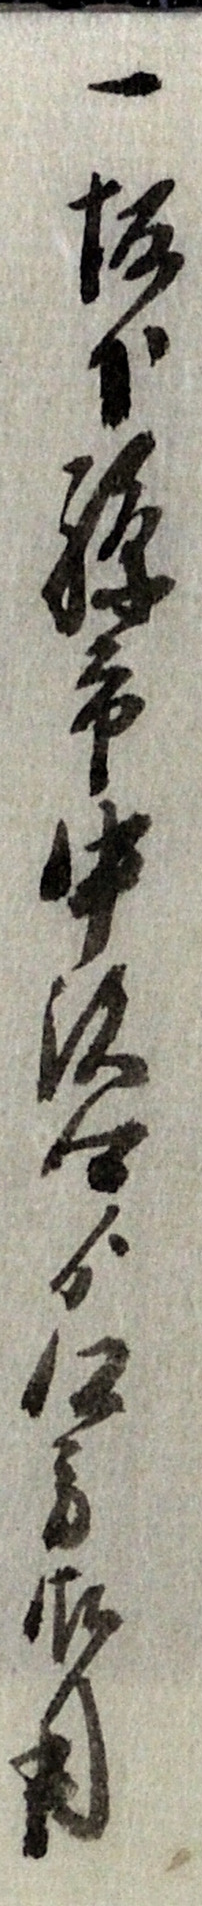一坂下孫市中沢郷ゟ郷方御用

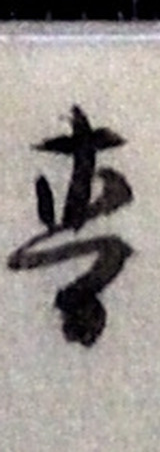廿一日
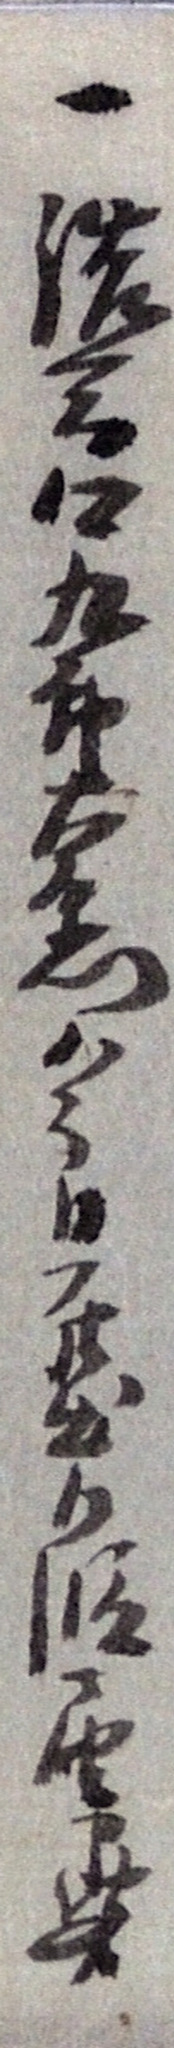一洗馬郷九郎右衛門今日罷出候段届申聞候
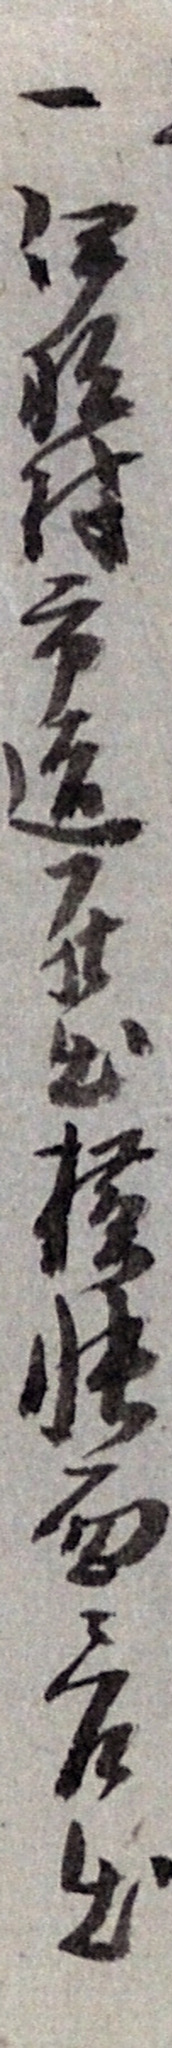一伊那村市造罷出横帳面差出
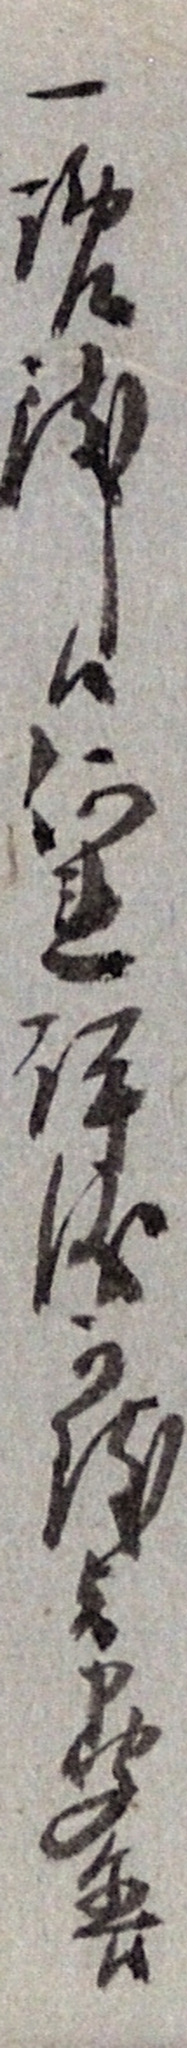一覧致し候何れ評儀可致旨申聞置候
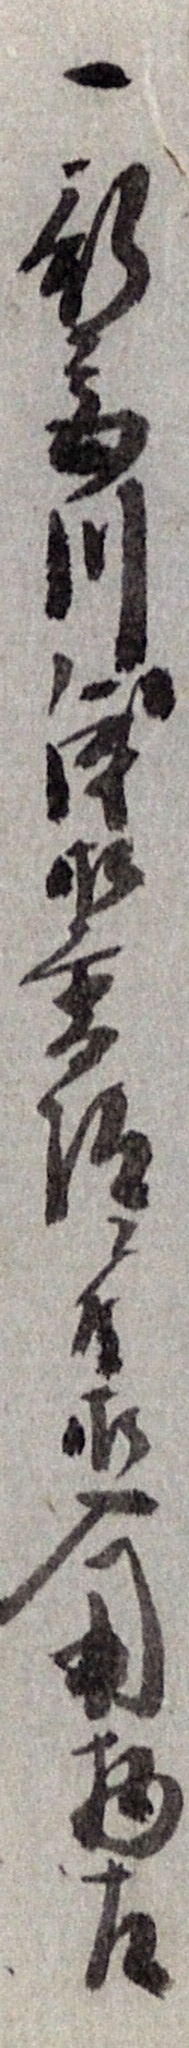一新宮川渡御普請ニ付御入用物左
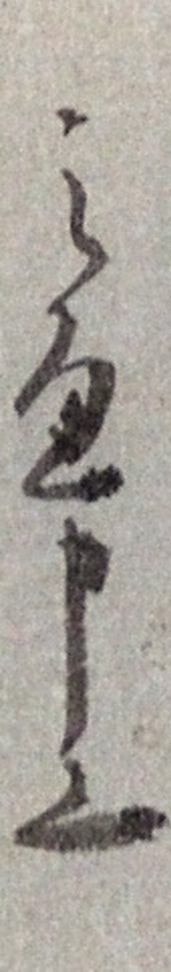之通申上
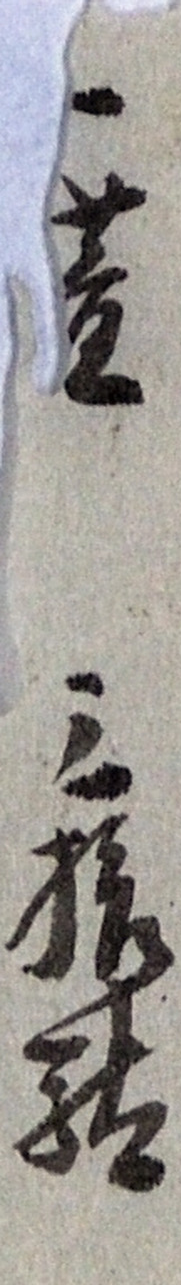一萱三拾駄
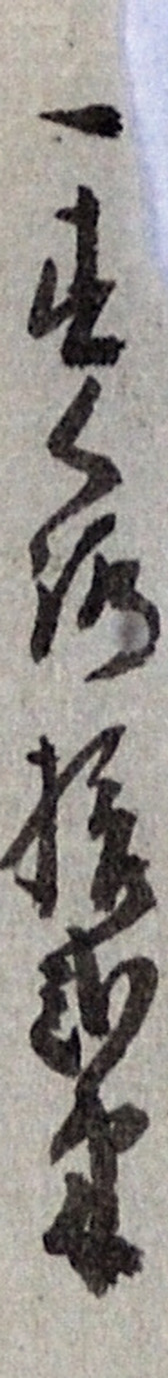一すくろ拾弐束
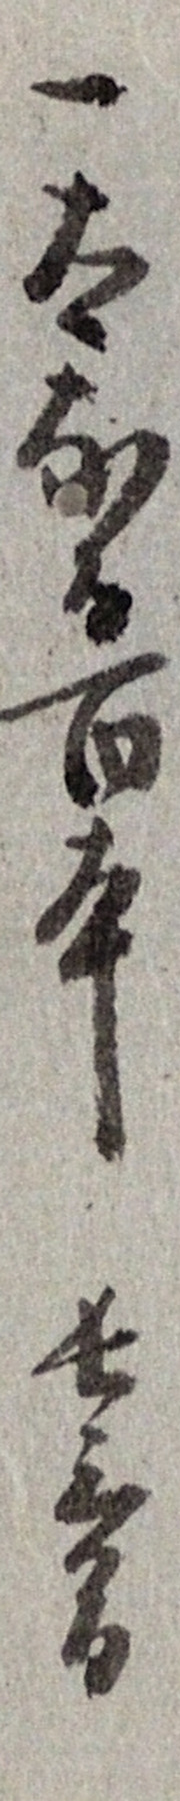一太なる百本長三間
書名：諸事御用留
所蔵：伊那市立高遠町図書館・合同会社AMANE
